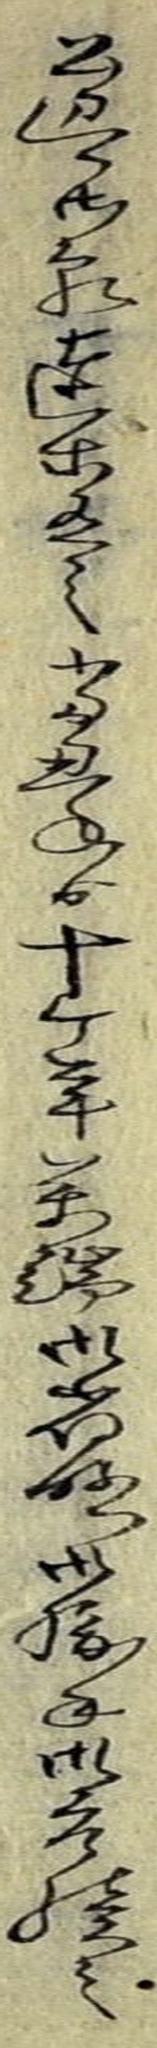公辺へ御願達等有之当丑年ゟ十ケ年万端御省略御勝手御取続之
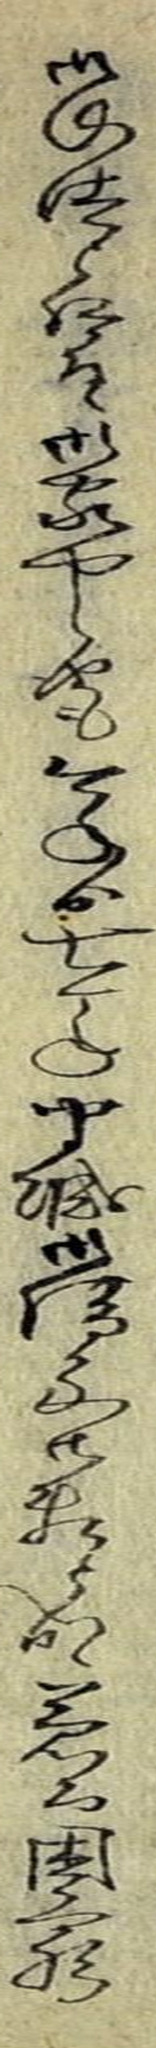御趣法被仰付候御家中之儀も今年ゟ七ケ年半減御借米御頼被成候兼而困窮
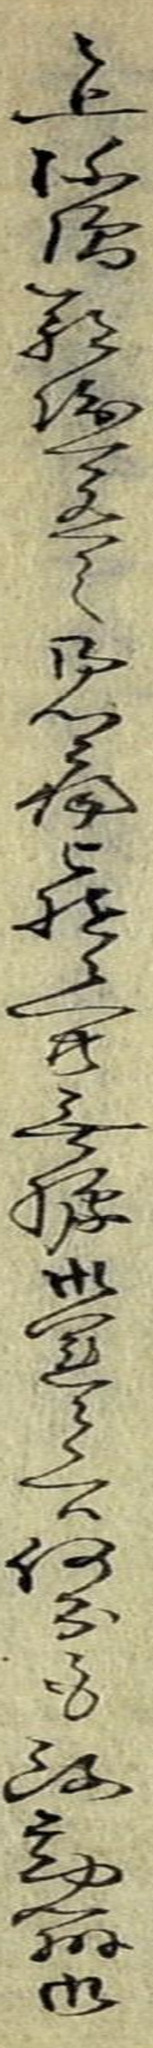之上弥増難儀可有之御心痛被遊候へ共無拠御運ニ候へハ何分ニも致勘弁御
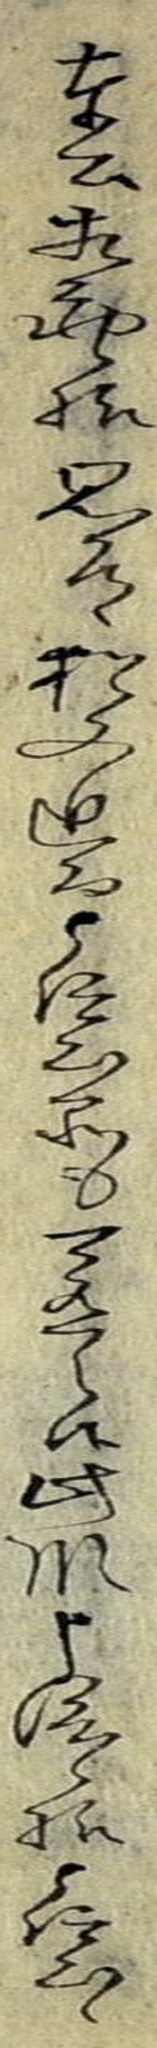奉公相勤候様思召候猶又廻而被仰出所も可有之候此段申渡候様被仰出候
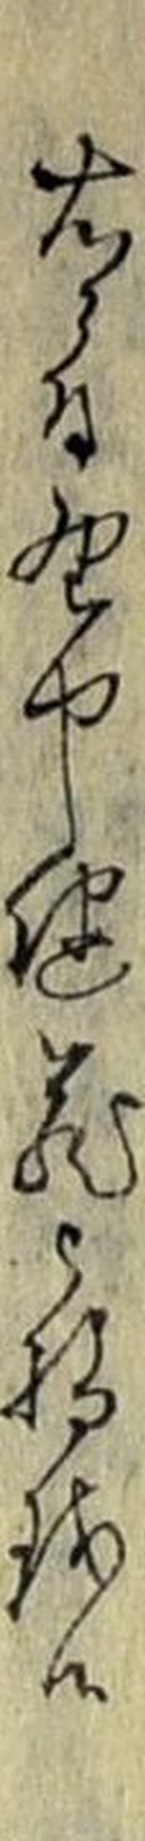右ニ付野中健蔵被指越候
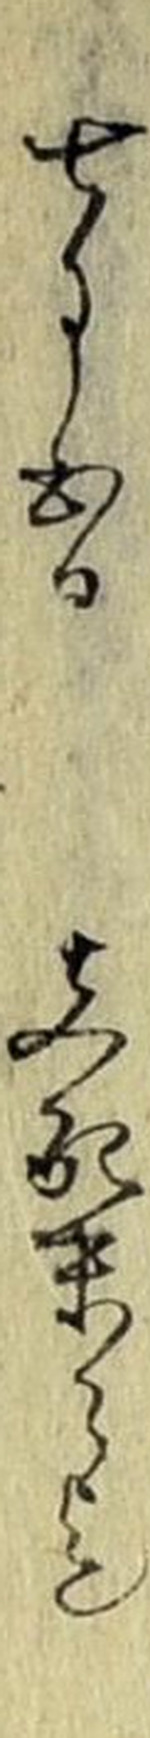七月五日支配末々迄
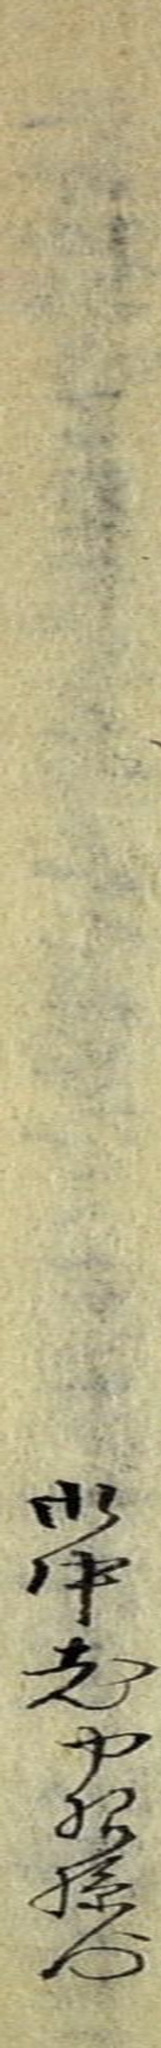御中老中根孫右衛門
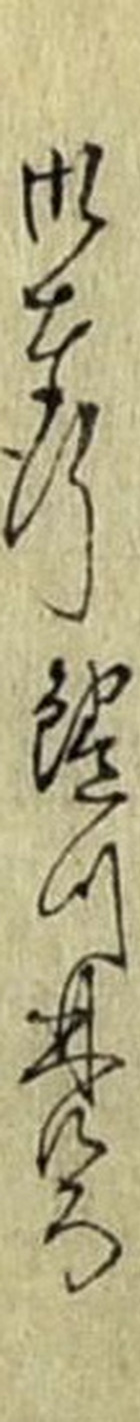御奉行蛭川林左衛門
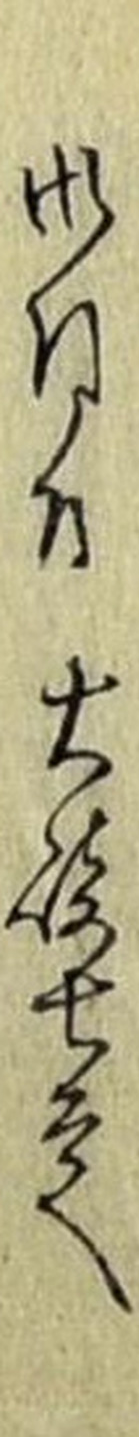御目付大崎七兵衛
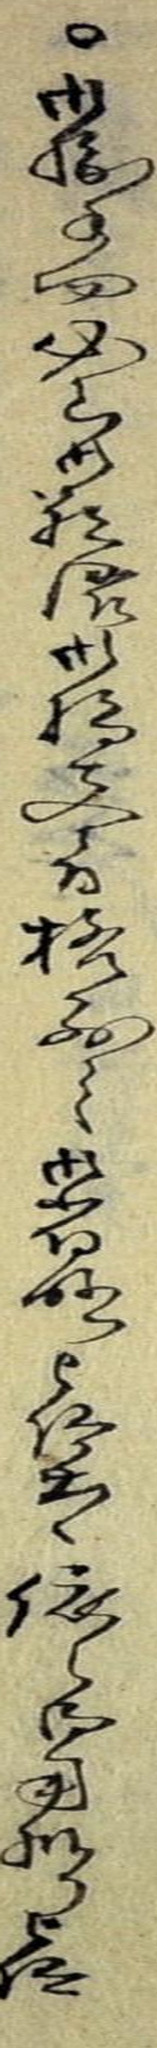○御勝手向必至御難渋御指支ニ付格別之御省略被仰出候依之御用掛り被仰
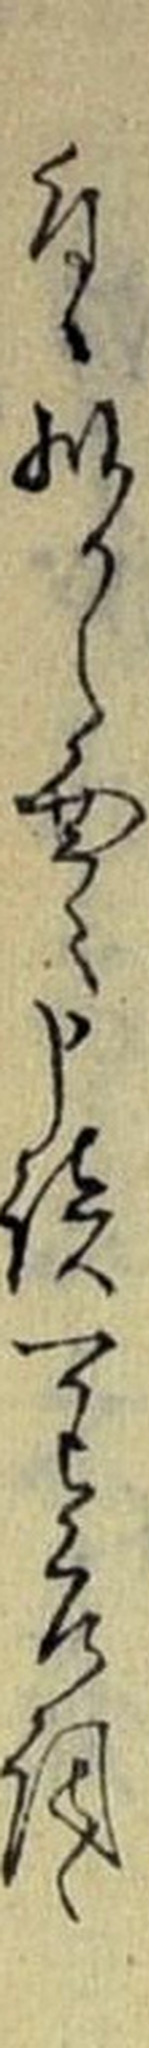付候掛り之面々申談可被取調候
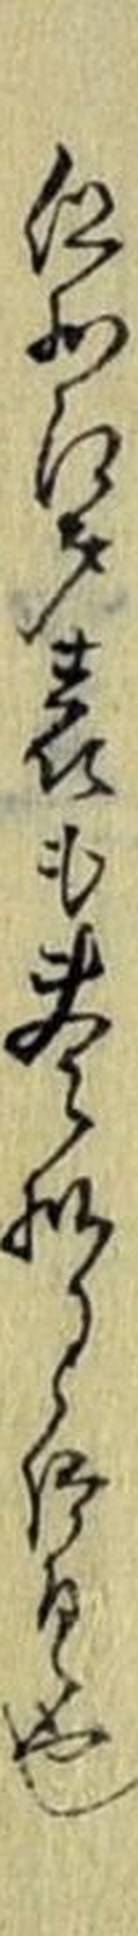同日但於江戸表も夫々掛り被仰付候也
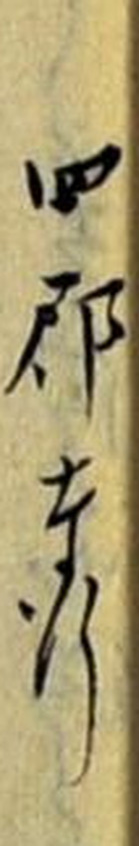四郡奉行
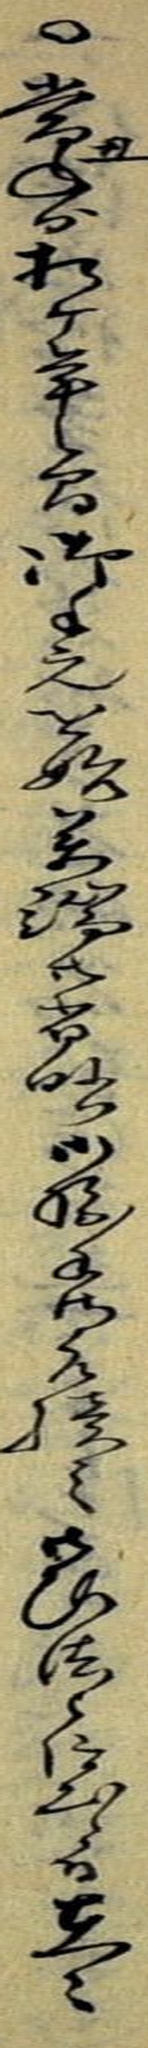○当丑年ゟ拾ケ年之間御手元を始万端御省略御勝手御取続之御趣法被仰出ニ付在々
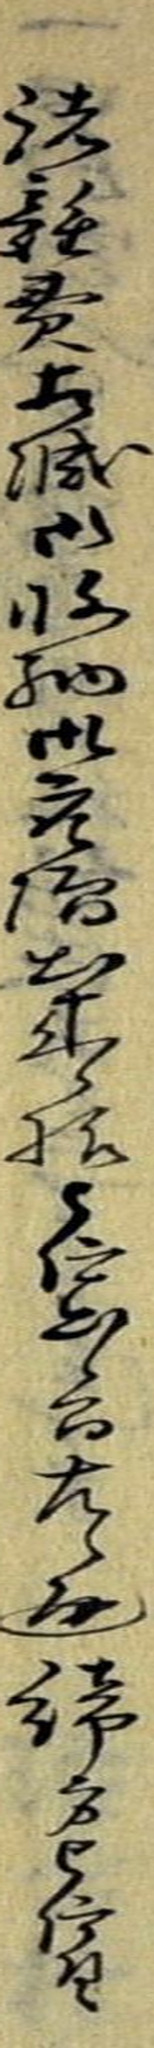諸雑費相減御収納御取増出来候様被仰出候間左之通締方被仰付候
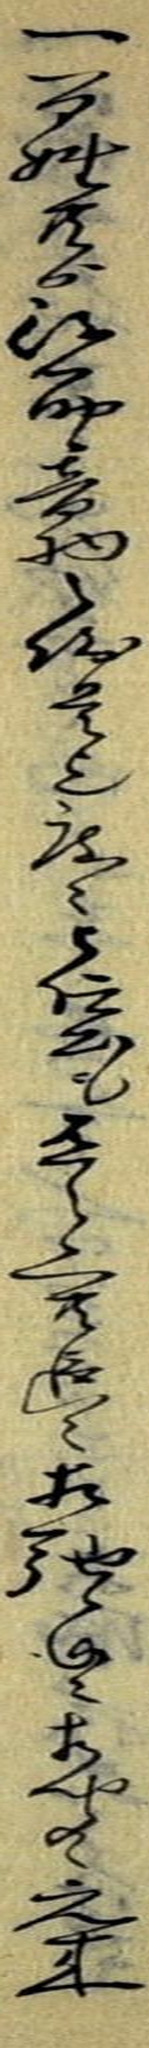一百姓共ゟ役筋音物之儀是迄度々被仰出も有之候へ共追々相弛候趣ニ相聞元来
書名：命令之部 五
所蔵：福井県文書館 Fukui Prefectural Archives
